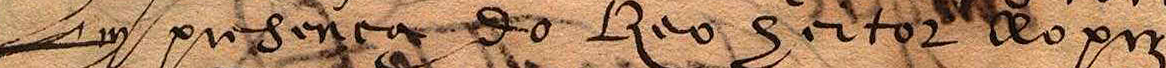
em presença do Reo heitor llopez
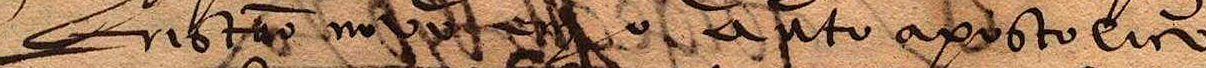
cristão novo em o auto apostolico
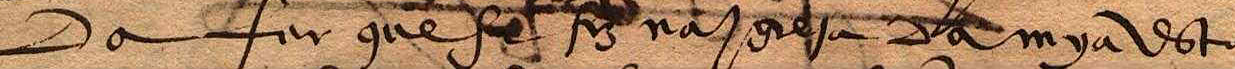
Da fee que se fez na jgreja da myā desta
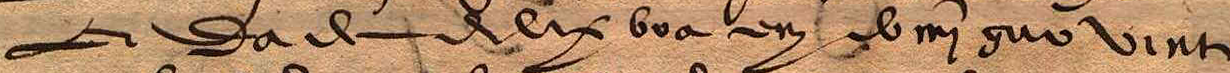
cidade de lixboa em domj̄guo vinte
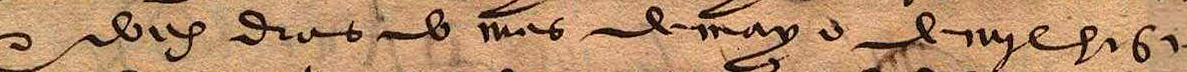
e dous dias do mes de mayo de mjl he bc
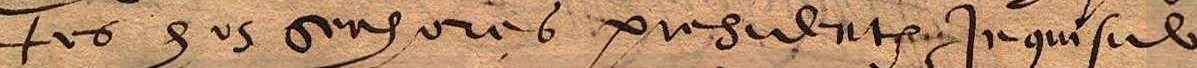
tes hos senhores presidentꝭ Jnquisido
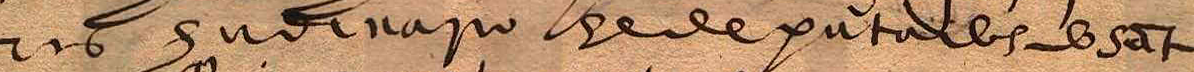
res E ordinario he deputados do sāto
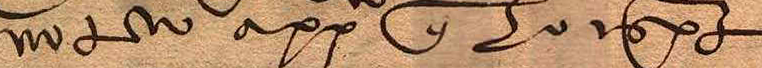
notro appco q̄ ho esp̄j
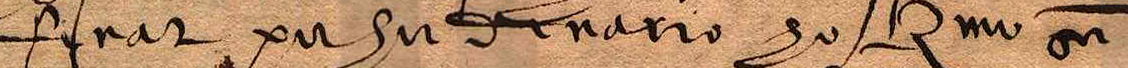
finaL por hordinario ho Rmo sor̄
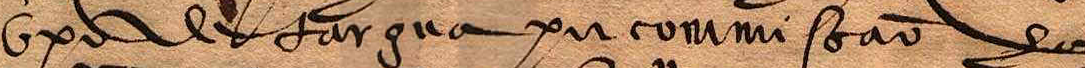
bpo de targua por commissaõ ha
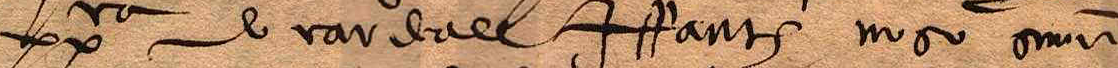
ppca do cardeall Jffantꝭ noso snor̄
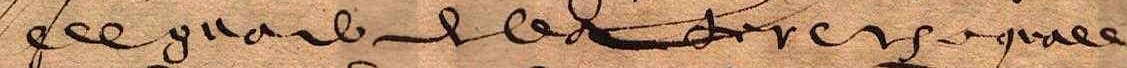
lleguado de llatere cꝭ o quall
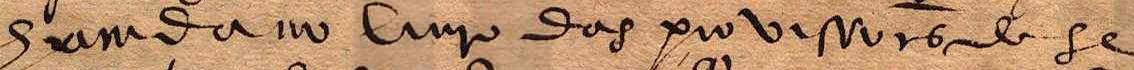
hamda no liuro das provissoẽs do se
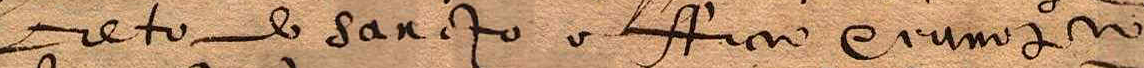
creto do sancto officio e eu notro
